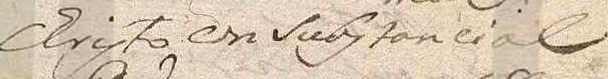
Christo consubstancial
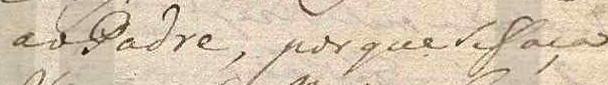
ao Padre, porque se faça
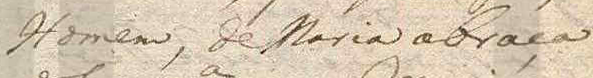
Homem, de Maria abraça
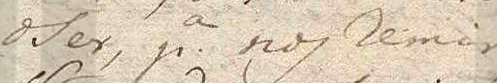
o Ser, p.a nos Remir
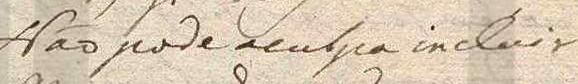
Não pode a culpa incluir
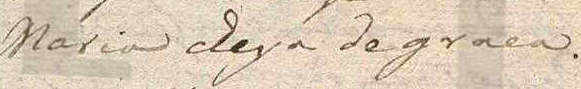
Maria cheya de graca.
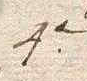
4.a
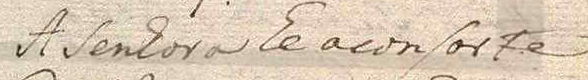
A Senhora he a consorte
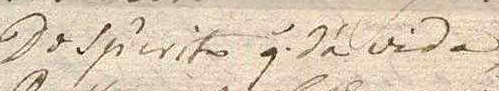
Do Spirito q̄. dá vida
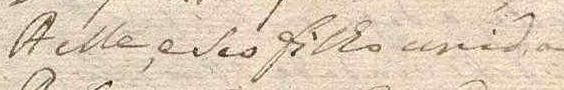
A elle, e Seo filho unido
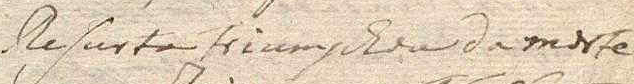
Resurta triumphou da morte
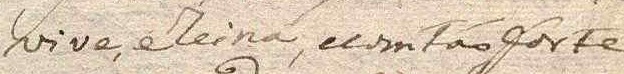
vive, e reina, e com taõ forte
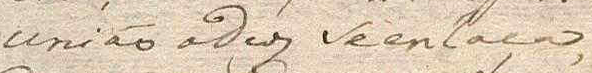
uniaõ a Deos se enlaça,
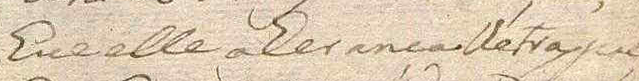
Que elle a herança lhe traspaça
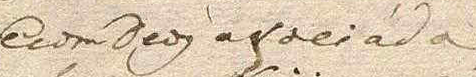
E com Deos asociada,
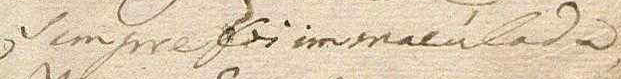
Sempre foi immaculada
